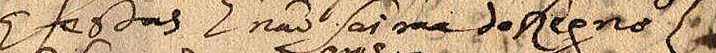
e festas E naõ sairaa do Regno
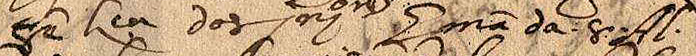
sē Lça dos jnqores E māda .s. Al.
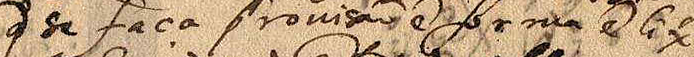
q̄ se faça prouisaõ ē forma ē lixa
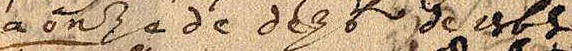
a onze de dezbro de 1565
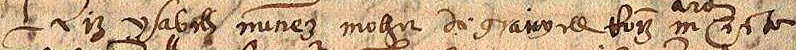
Diz ysabell nun̄ez molher de grauyell Roīz mores ē eta
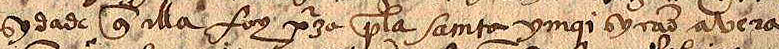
sydade q̄ ella foy p̄za p̄la Samta ymqisycaõ avera
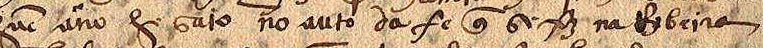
hū an̄o he saio no auto da fe q̄ se fez na Rybeira
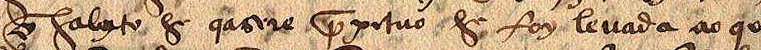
cō habyto he qasere p̄petuo he foy leuada ao qo
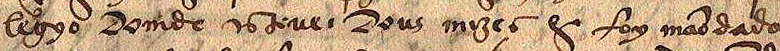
legyo Domde esteue Dous mezes he foy maõdada
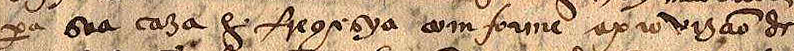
ꝑa sua caza he fregesya comforme a provizaõ de
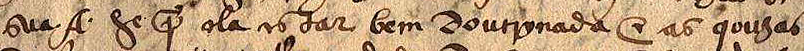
sua .A. he p̄o ela estar bem Doutrynada ē as qouzas
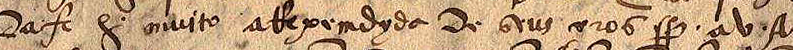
da fe he muito aRepemdyda De seus eros pp. a V. A.
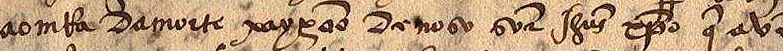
a omRa Da morte payxão De noso sor̄ Jhūs xp̄o q̄ aVē
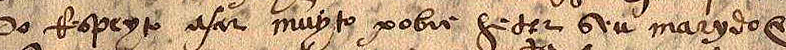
Do Respeyto a ser muyto pobre he ter seu marydo ē
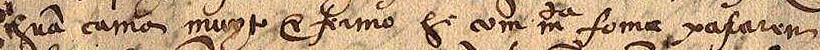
huā cama muyto ēfermo he com mta fome pasarem
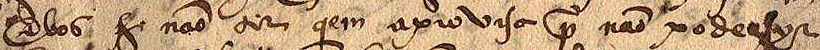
ābos he não ter qem a proviJa p̄o não poder hyr
